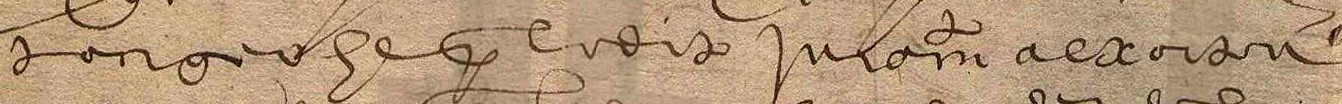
tangeo he p̄lo dito Juramto a exortou
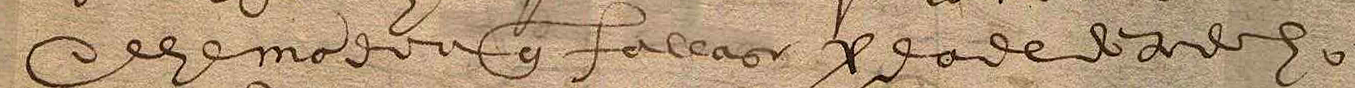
e lhe mādou q̄ fallase ꝟdade de todo ho
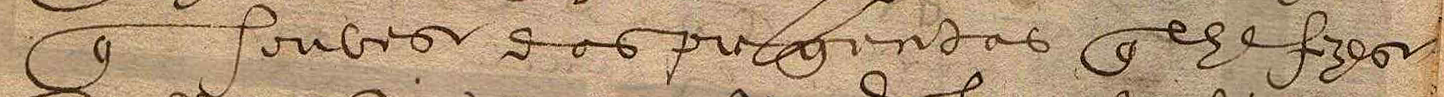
q̄ soubese das preguntas q̄ lhe fezese
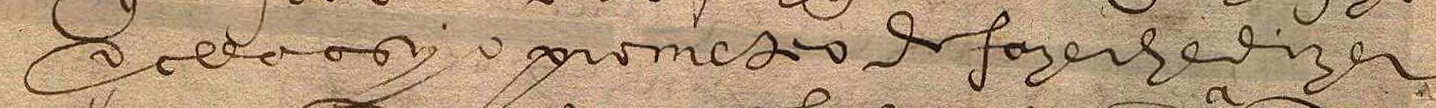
e ella asy o prometeo de fazer he dizer
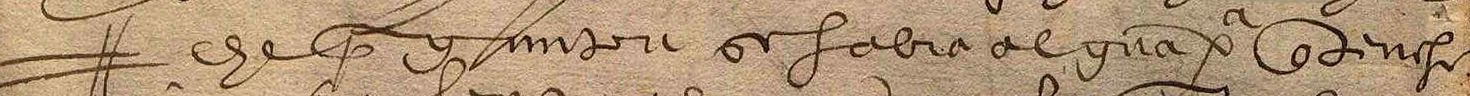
item lhe p̄gumtou se sabia algūa pa q̄ teuese
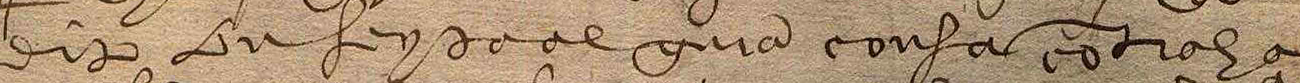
dito ou feyta alguā cousa c̄otra ha
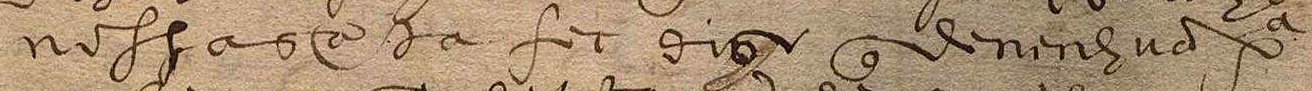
nossa sāta fee dise q̄ de nenhuā pa
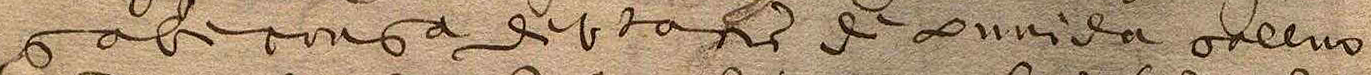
sabe cousa de vta nē de ouuida salluo
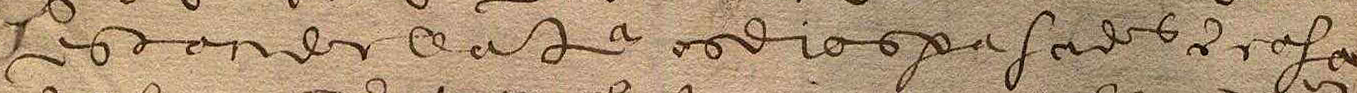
estando ella ta os dias pasados ē casa
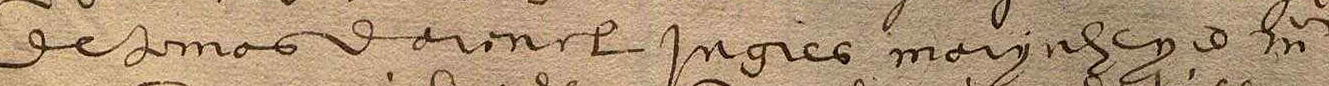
de tomas dareneL Jngres marynheyro mor
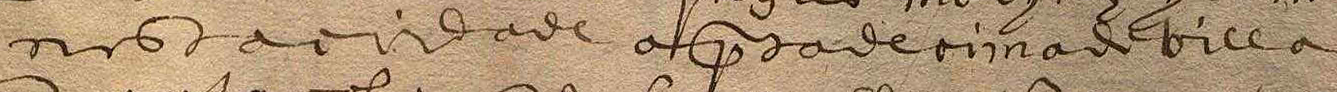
nesta cidade a p̄ta de cima de villa
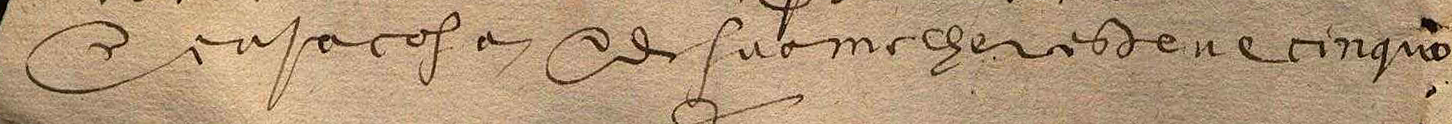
ē cuja casa, e de sua molher esteue cinquo
